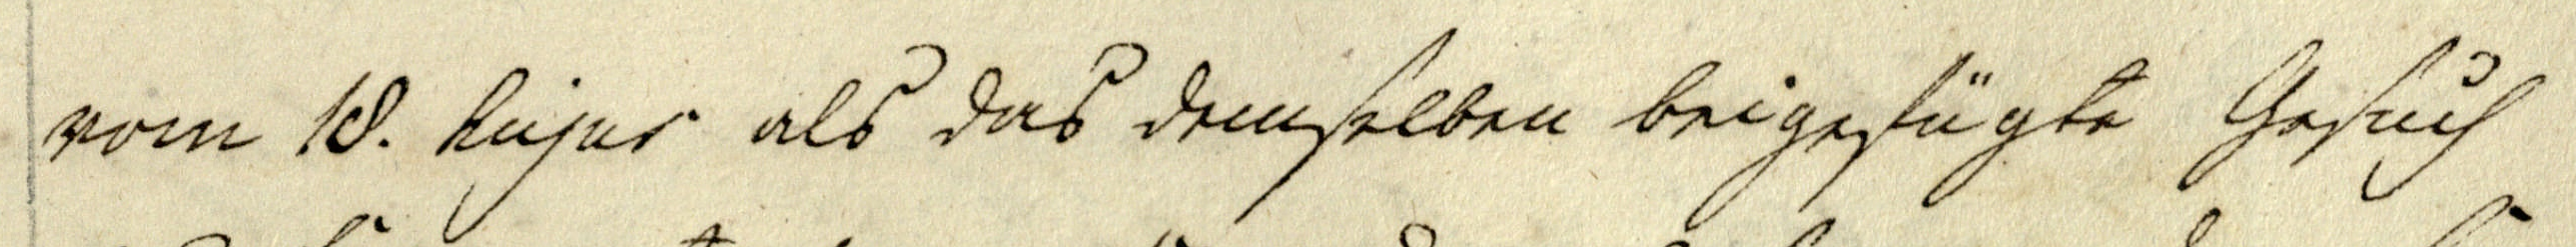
vom 18. hujus als das demselben beigefügte Gesuch
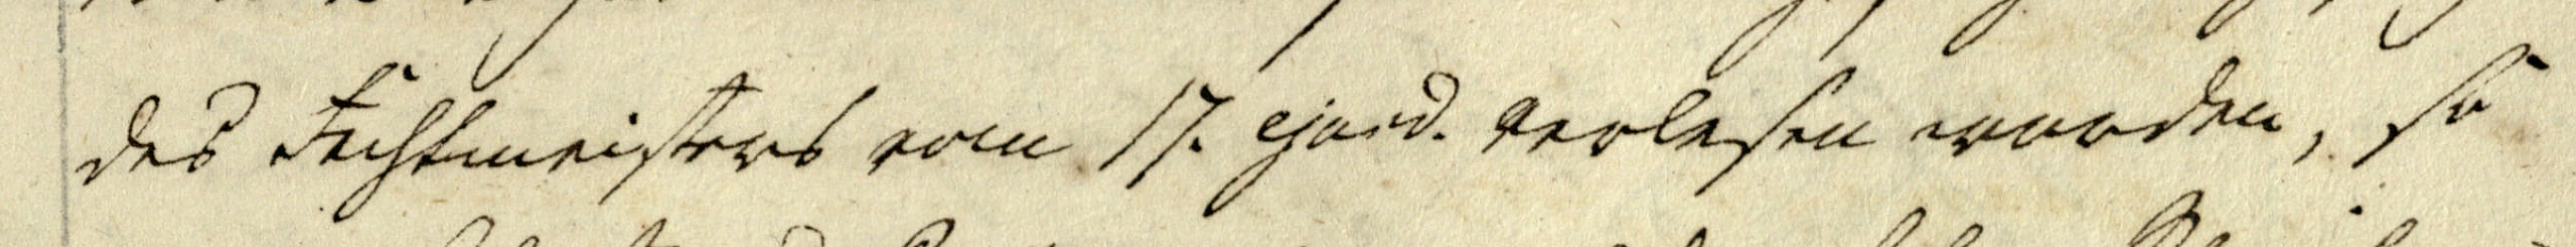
des Fechtmeisters vom 17. ejusd. verlesen worden, so
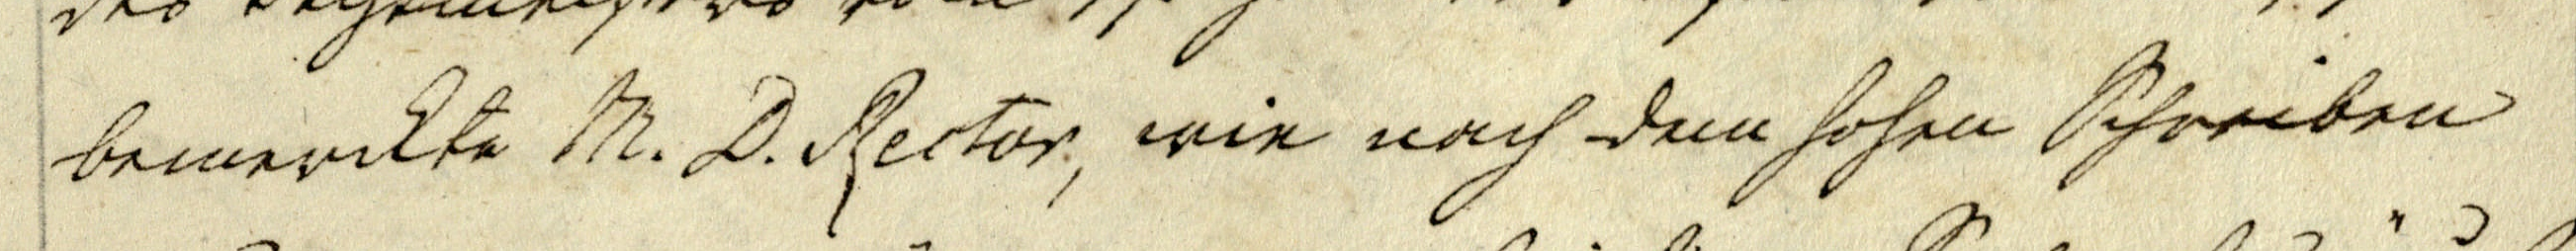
bemerckten M. D. Rector, wie nach dem Hohen Schreiben
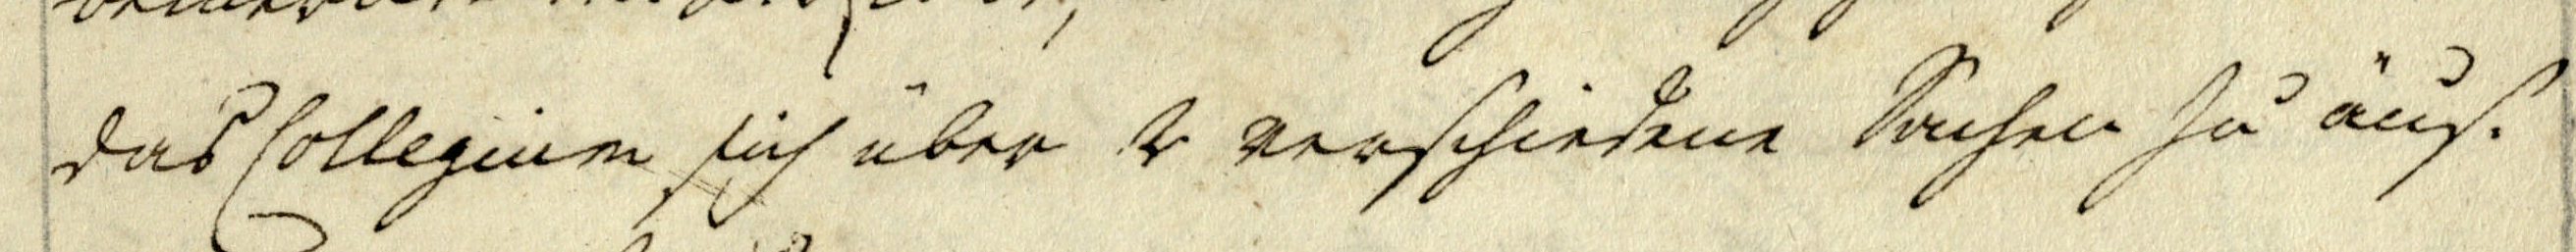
das Collegium sich über 2 verschiedene Sachen zu äus¬
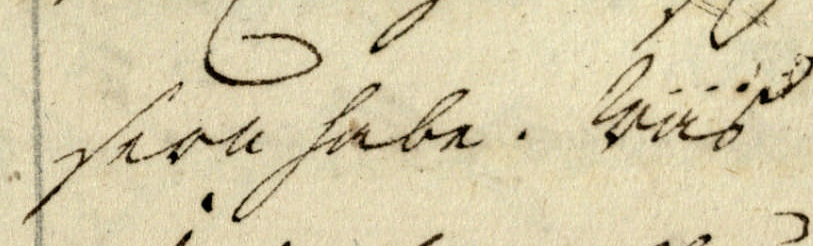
sern habe. Was
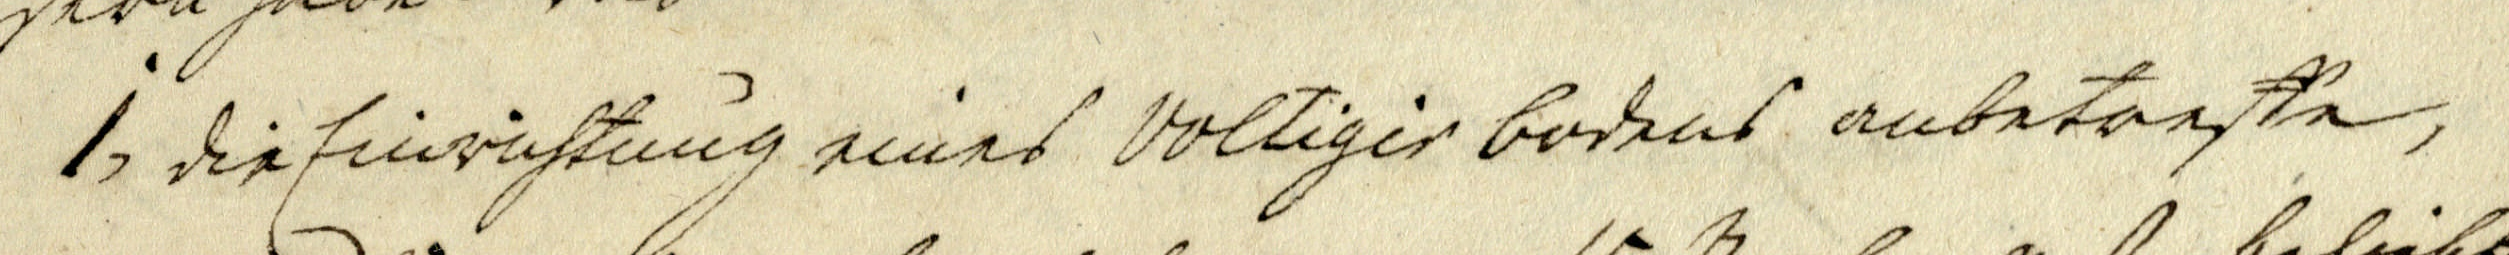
1. die Einrichtung eines Voltigirbodens anbetreffe,
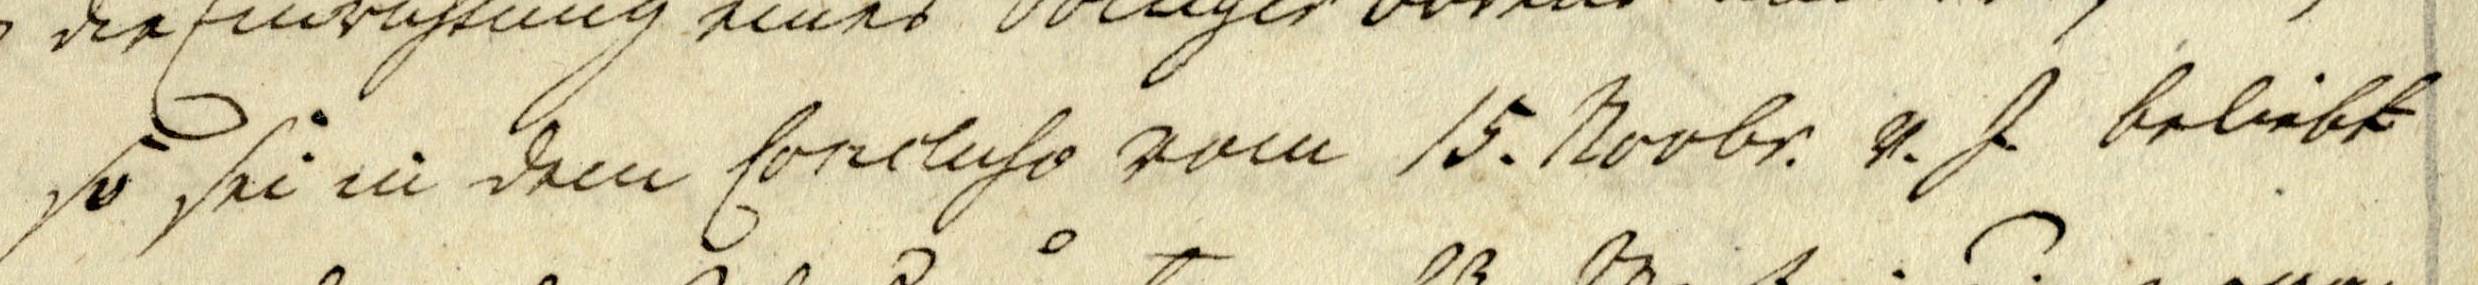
so sei in dem Concluso vom 15. Novbr. v. J. beliebt
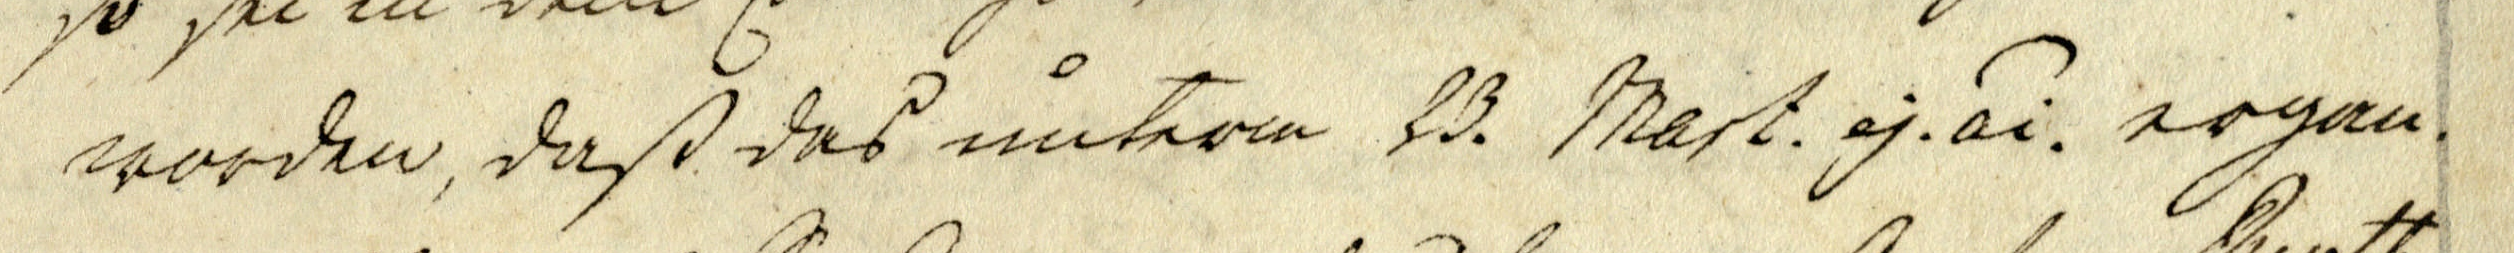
worden, daß das unterm 23. Mart. ej. ai. ergan¬
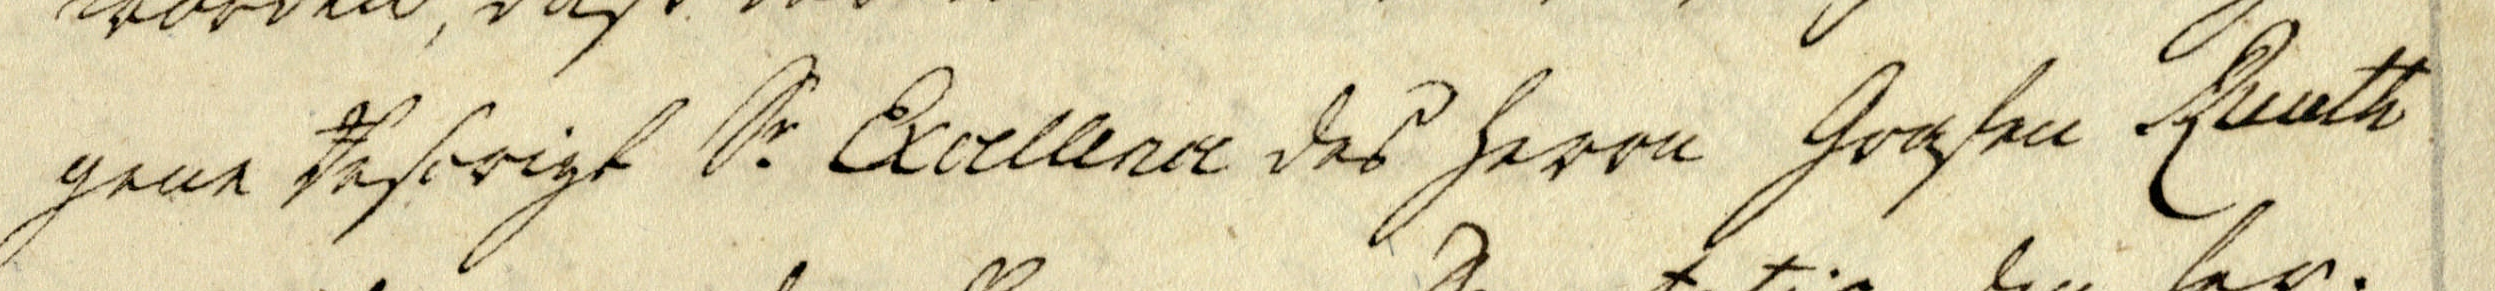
gene Rescript Sr Excellence des Herrn Grafen Ruuth
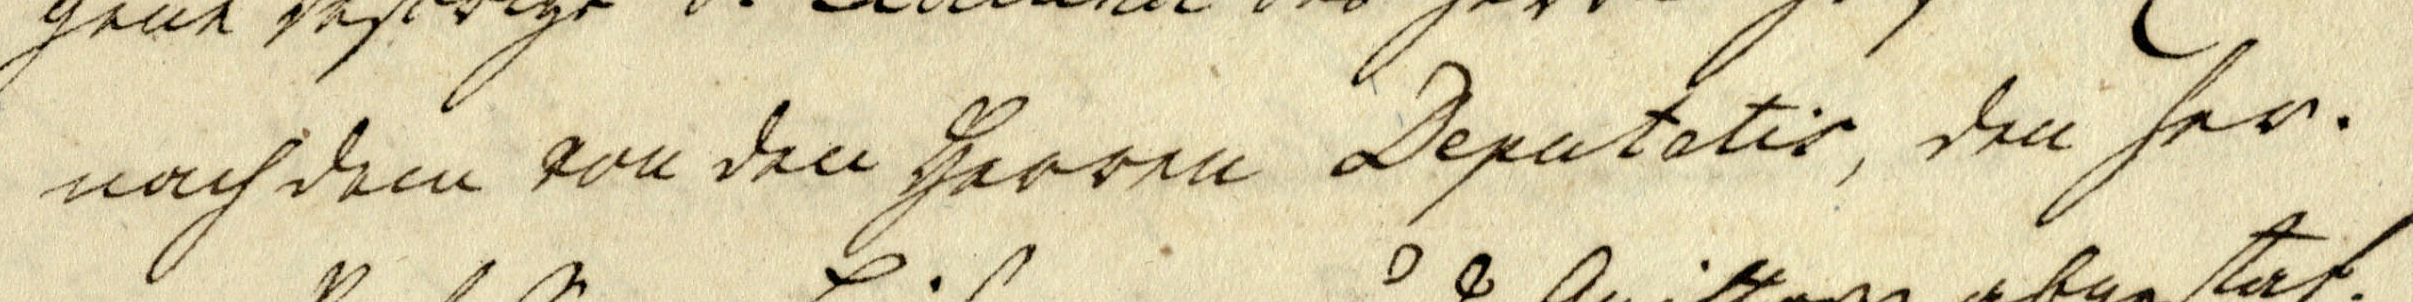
nach dem von den Herren Deputatis, den Her¬
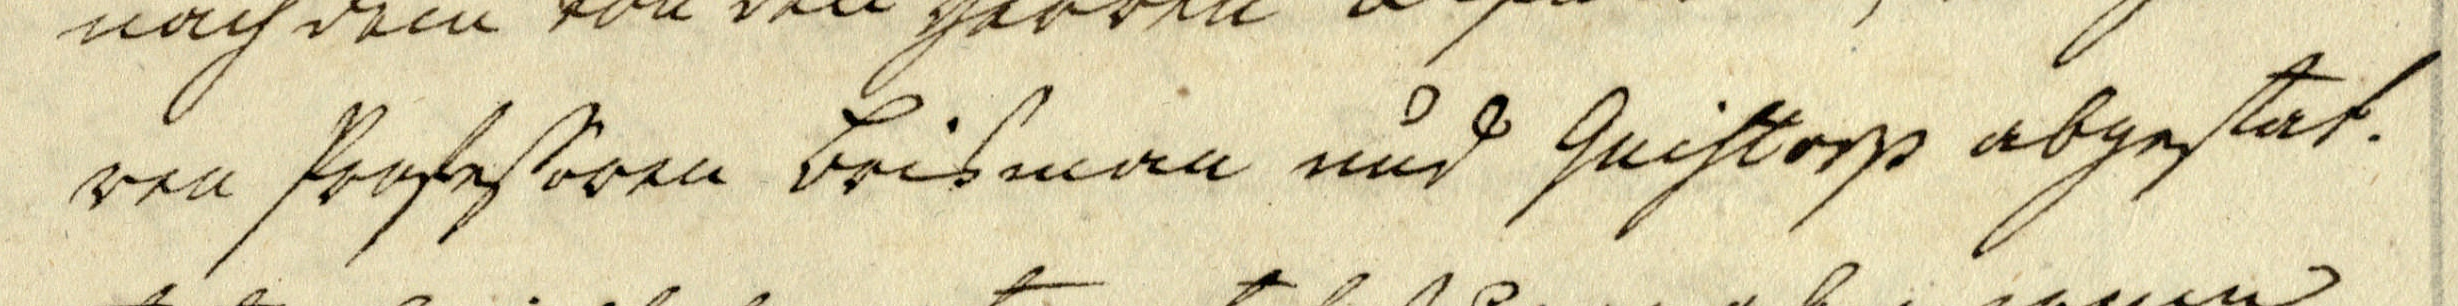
ren Professoren Brisman und Quistorp abgestat¬
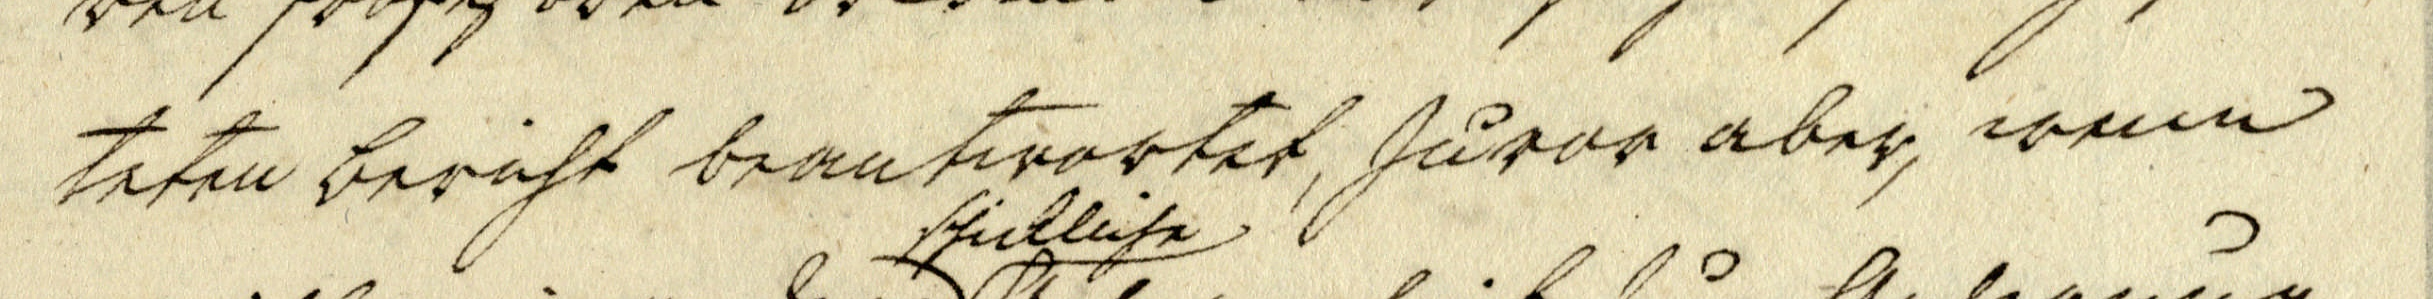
teten Bericht beantwortet, zuvor aber, wenn
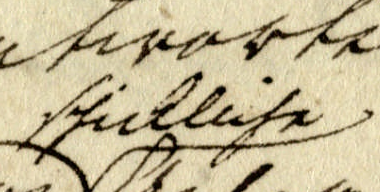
schickliche
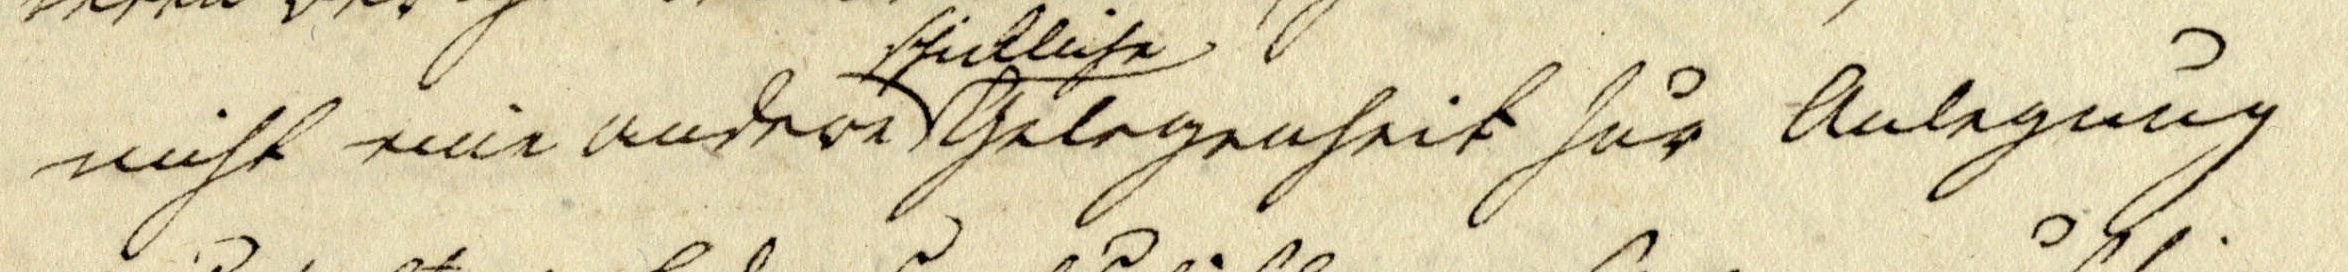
nicht eine andere Gelegenheit zur Anlegung
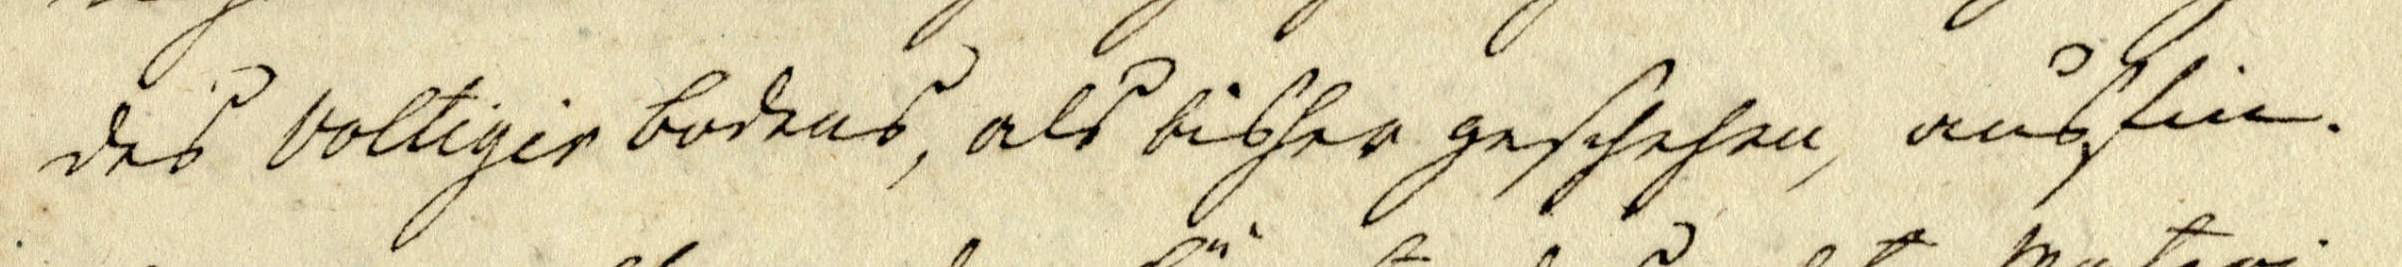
des Voltigir Bodens, als bisher geschehen, ausfin¬
